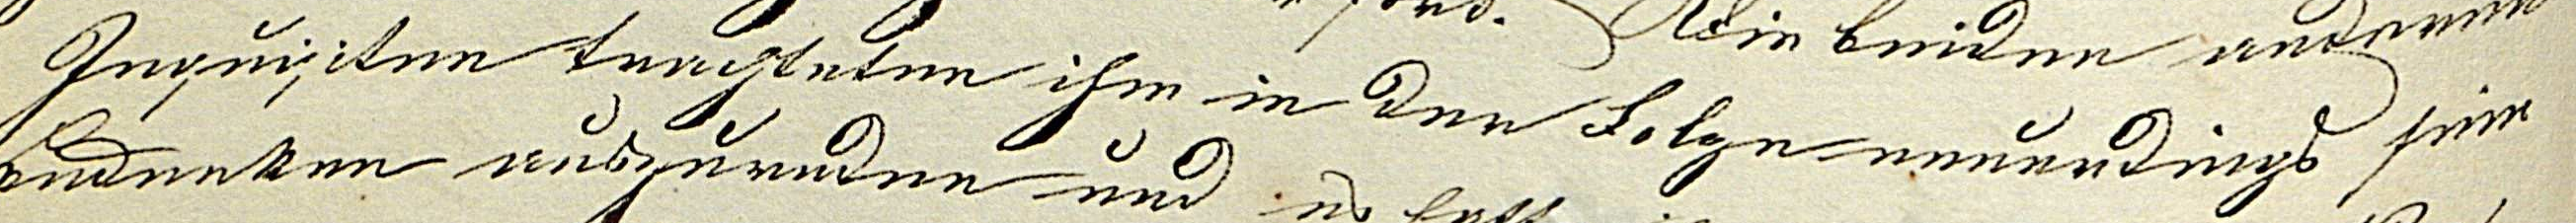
Inquisiten trachteten ihm in der Folge neuerdings sein
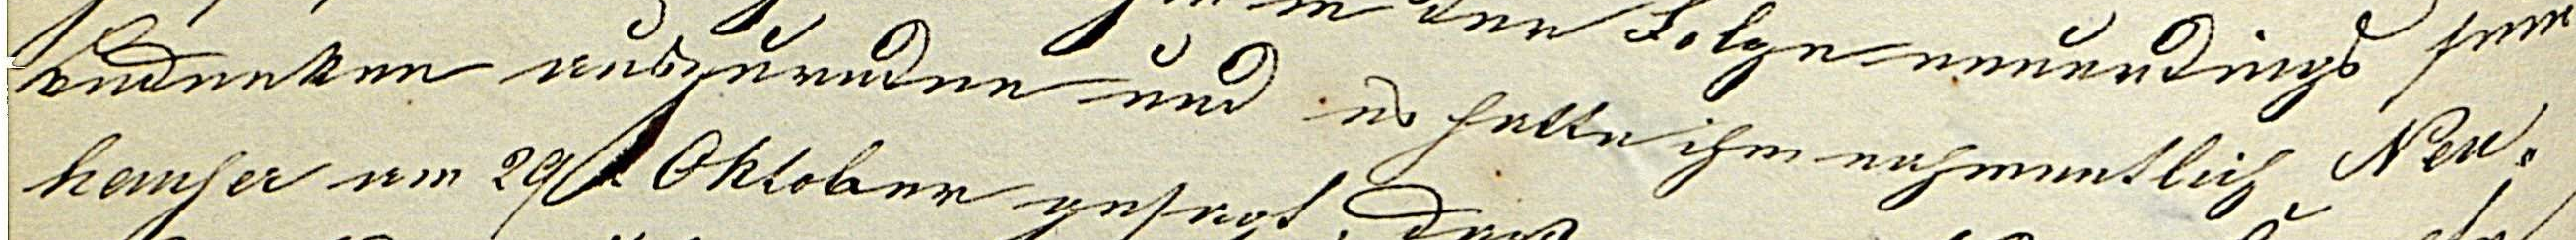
Bedenken auszureden und es hatte ihm nahmentlich Neu¬
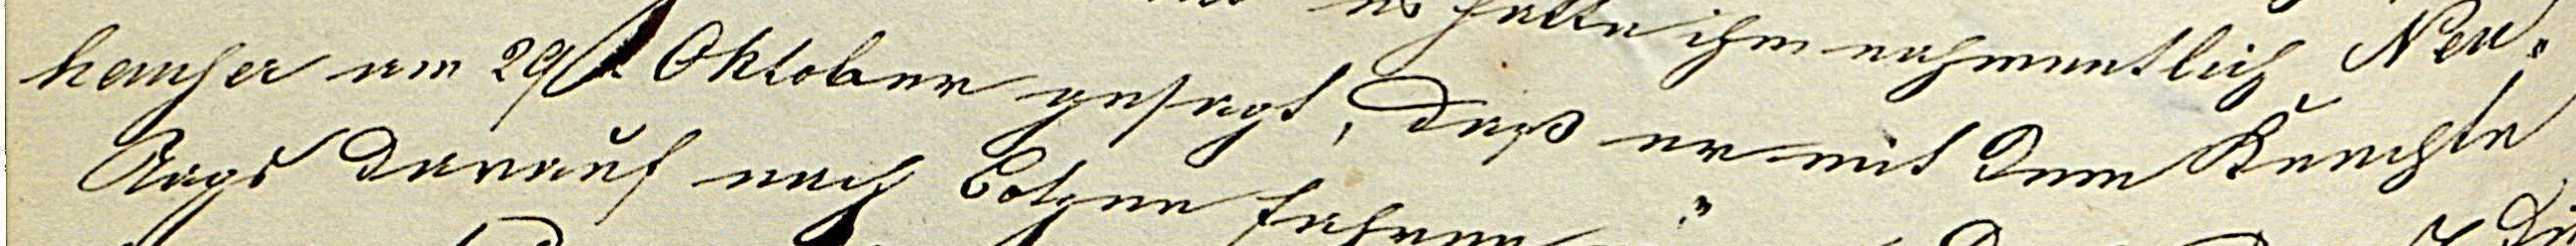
hauser a 29 Oktober gesagt, daß er mit dem Knechte
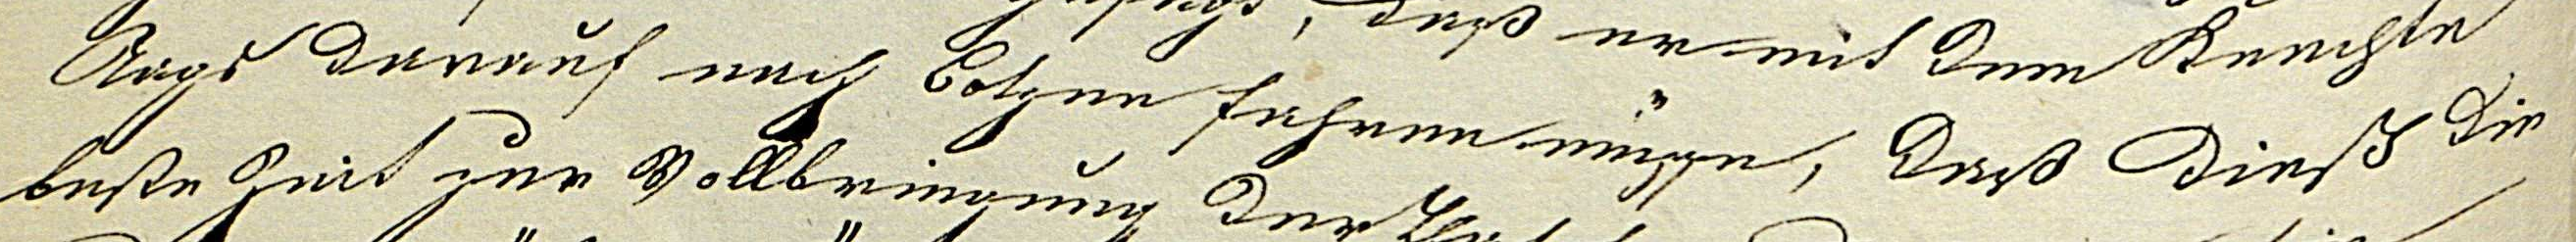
Tags darauf auch Cotzen fahren müsse, daß dieß die
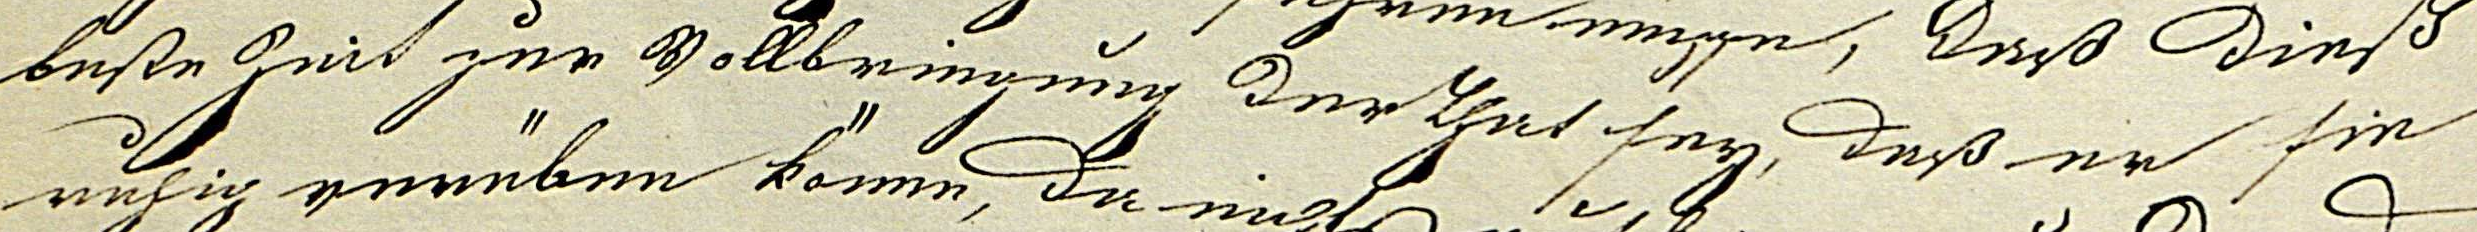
beste Zeit zur Vollbringung der That sey, daß er sie
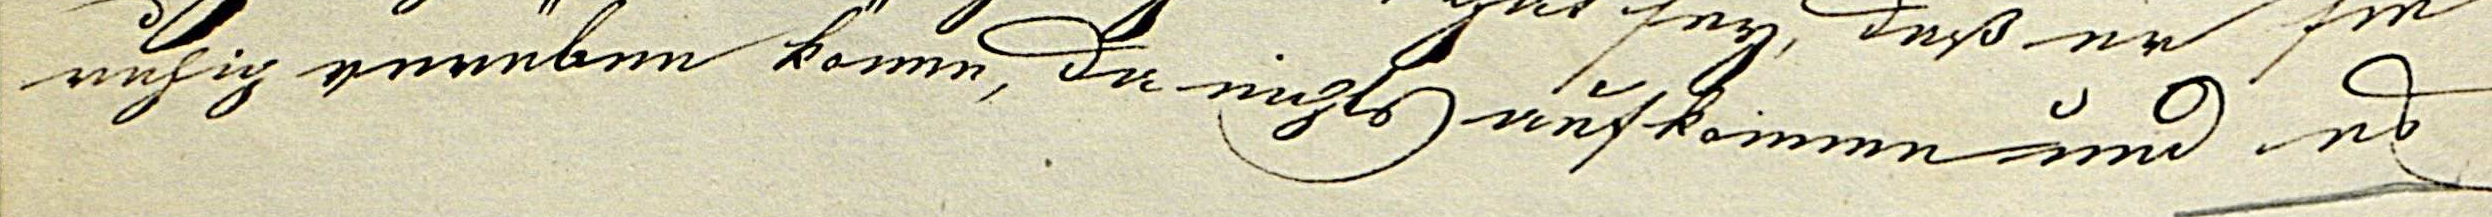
ruhig verüben könne, da nichts aufkommen und es
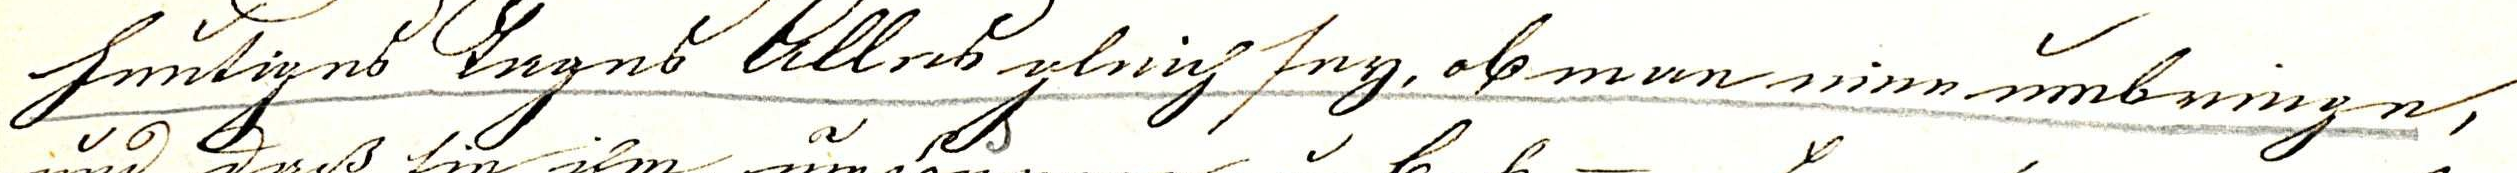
heutiges Tages Alles gleich sey, ob man eine umbringe,
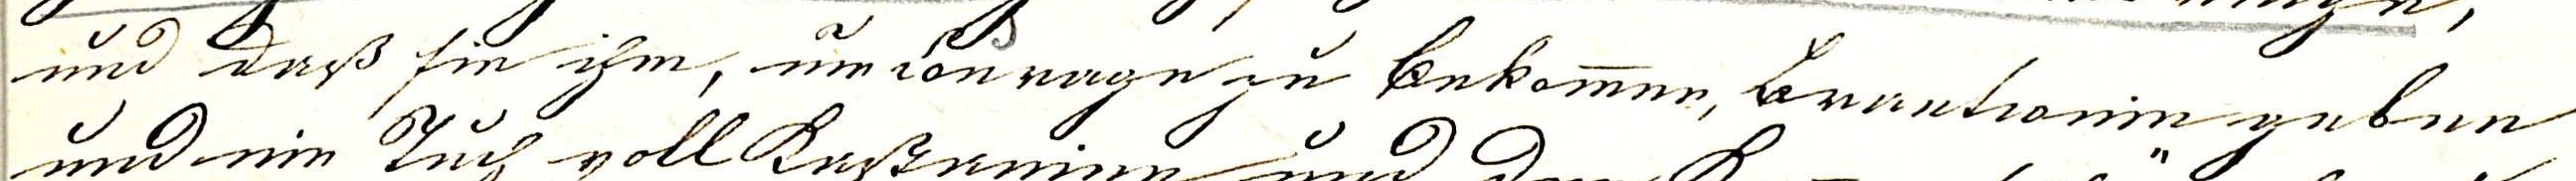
und daß sie ihm, um Courage zu bekommen, Brantwein geben
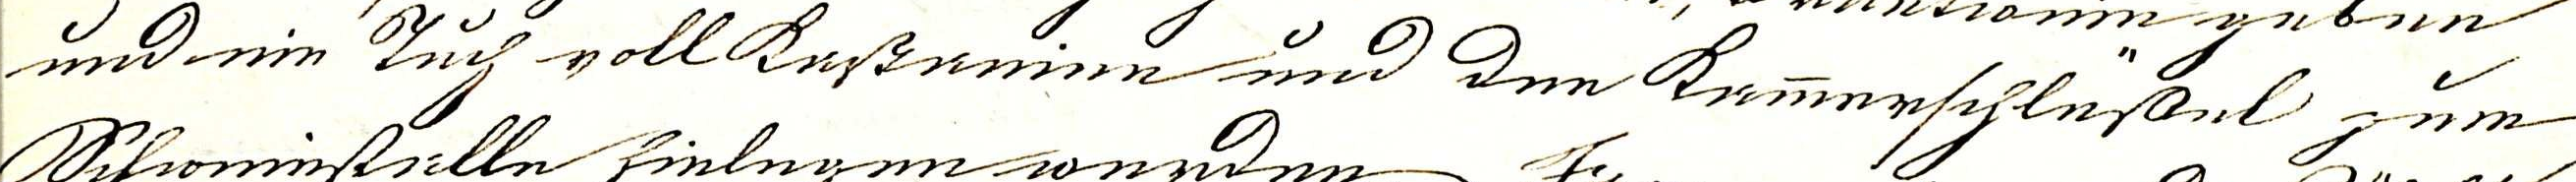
und ein Tuch voll Kastanien und den Kammerschlüßel zum
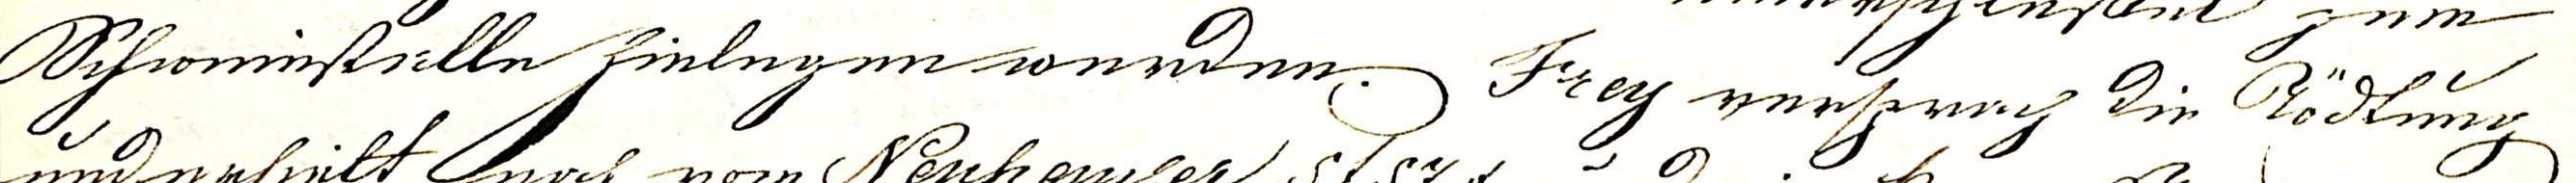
Schweinstalle hinlegen werden. Frey versprach die Tödtung
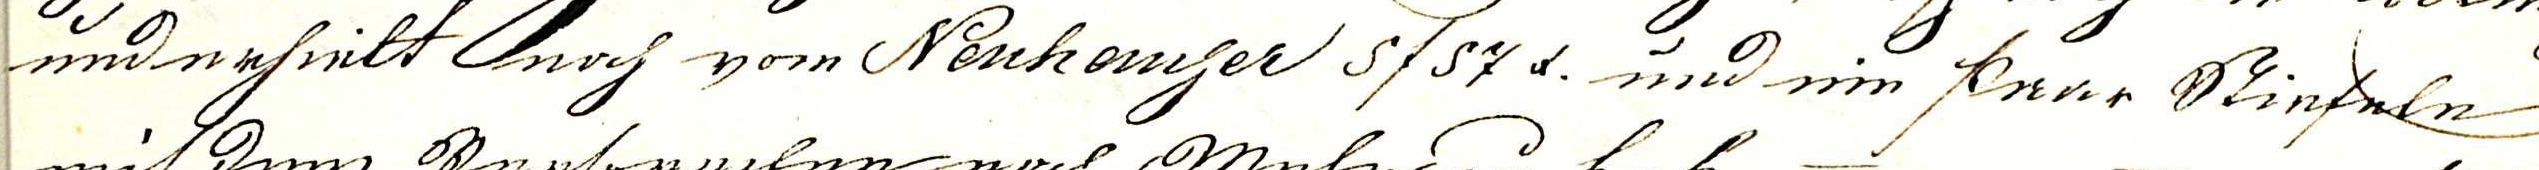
und erhielt noch vom Neuhauser 5f 57x und ein Paar Stiefeln
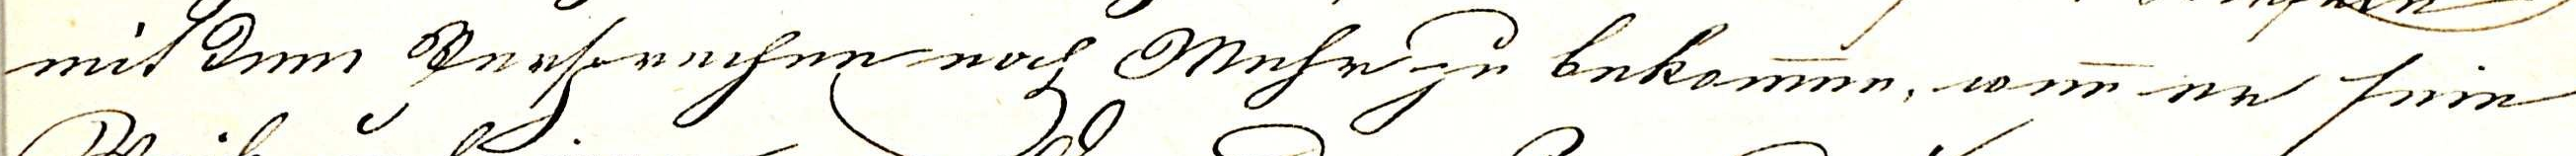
mit dem Versprechen noch Mehr zu bekommen, wenn er sein
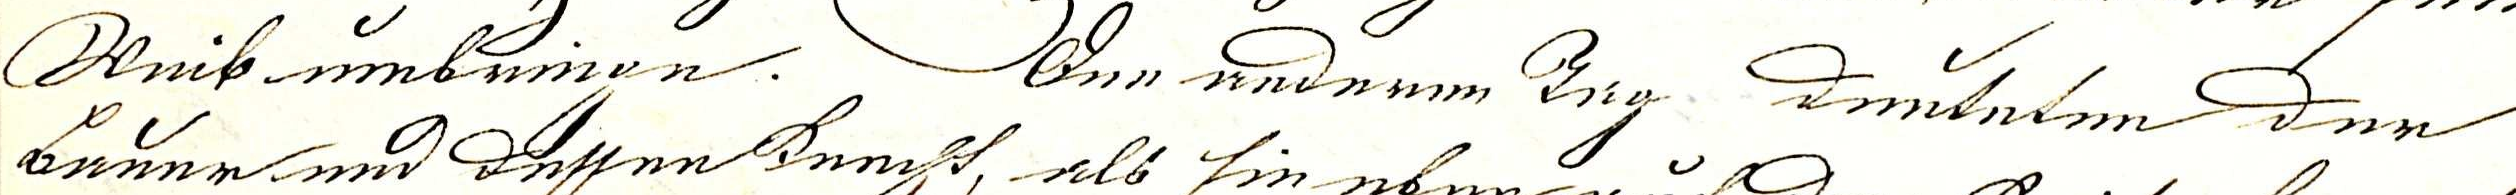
Weib umbringe. Den anderen Tag deuteten der
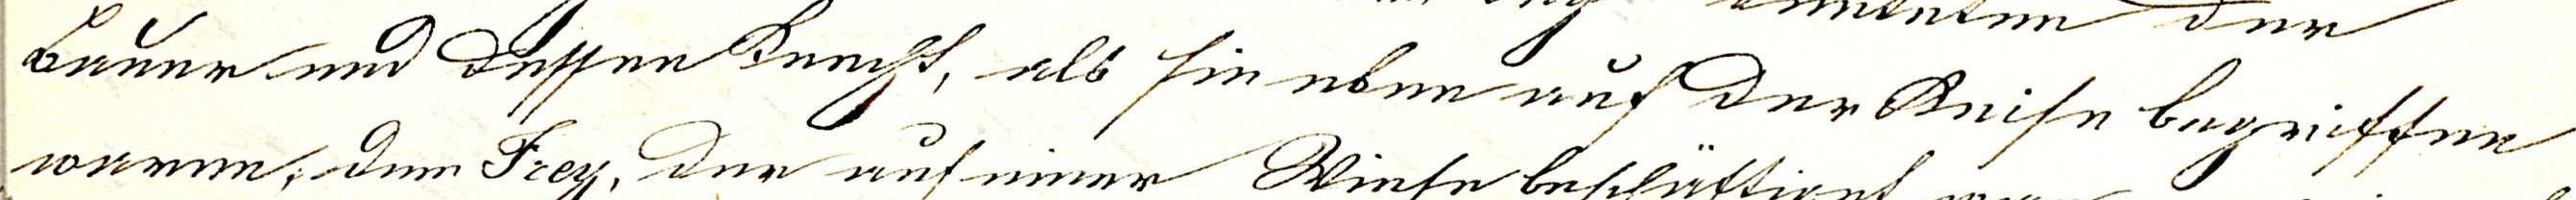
Bauer und dessen Knecht, als sie eben auf der Reise begriffen
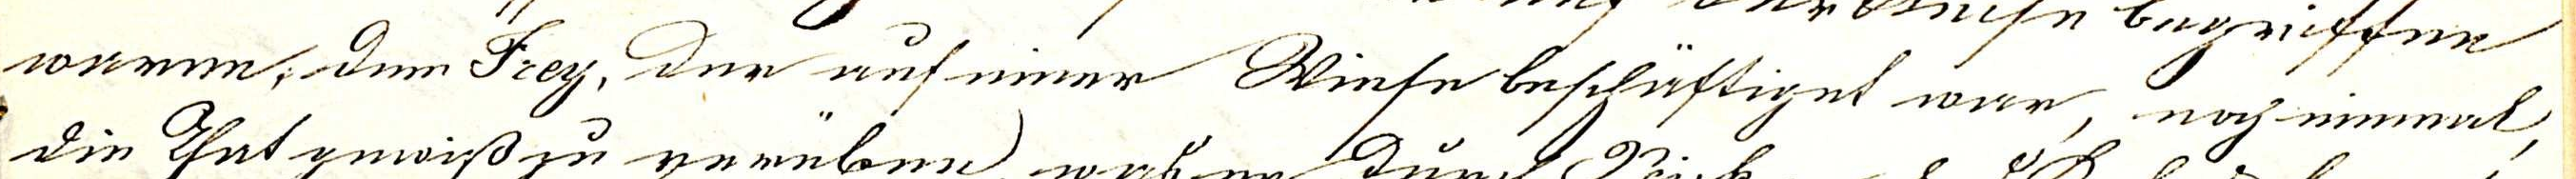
waren, dem Frey, der auf einer Wiese beschäftiget war, noch einmal
